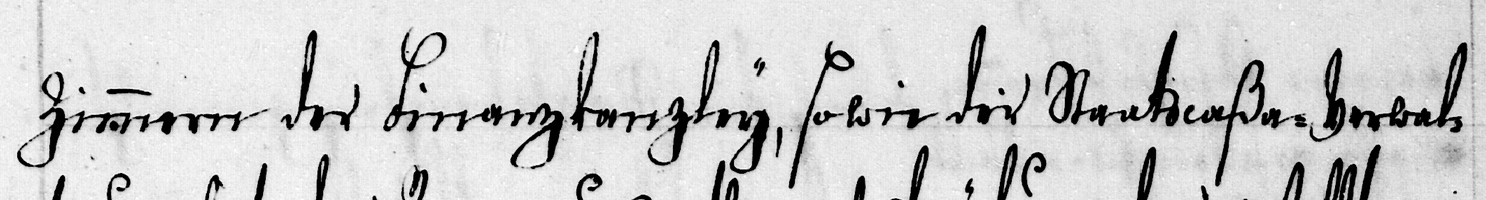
Zimmern der Finanzkanzley, sowie der Staatscaßa-Verwal¬
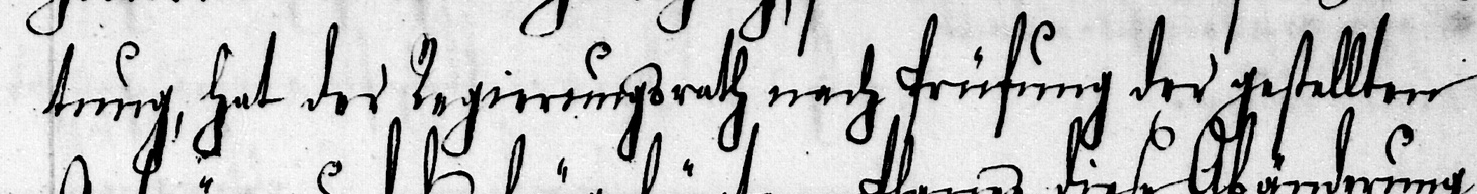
tung, hat der Regierungsrath nach Prüfung der gestellten
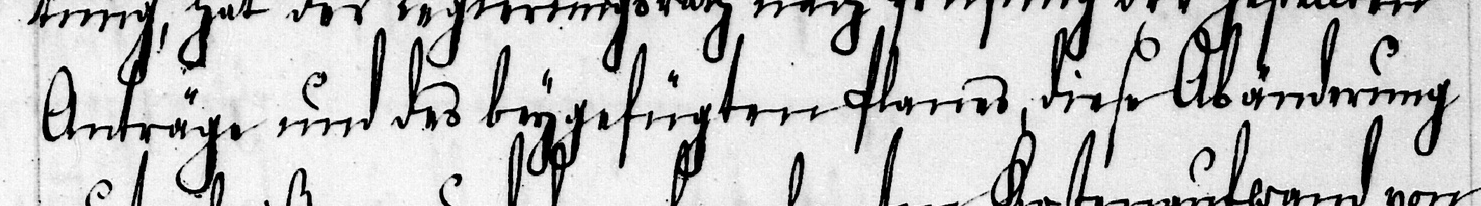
Anträge und des beygefügten Planes diese Abänderung
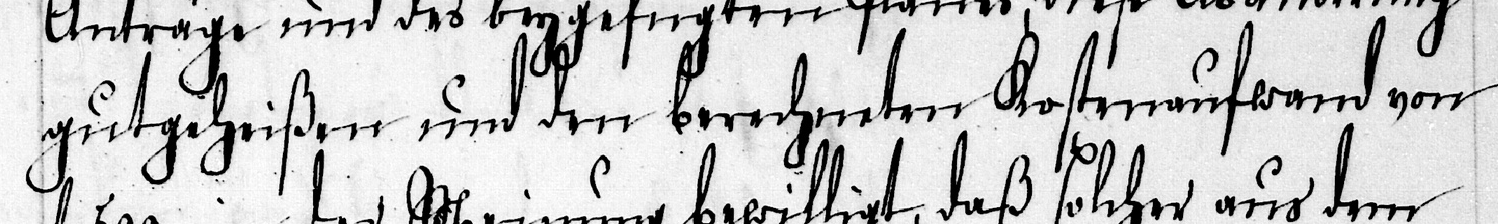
gutgeheißen und den berechneten Kostenaufwand von
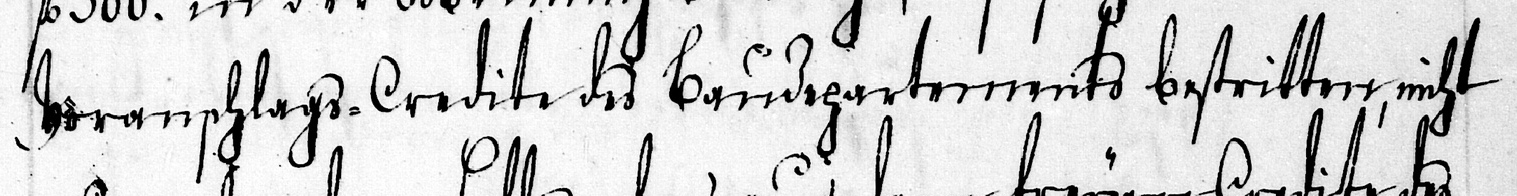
Voranschlags-Credite des Baudepartements bestritten, nicht
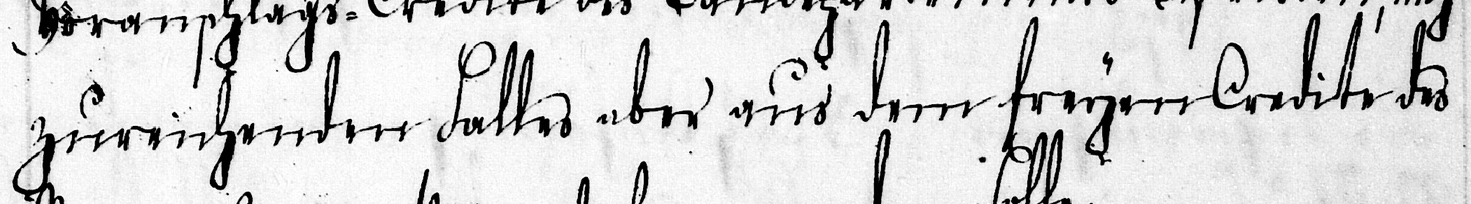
zureichenden Falles aber aus dem freyen Credite des
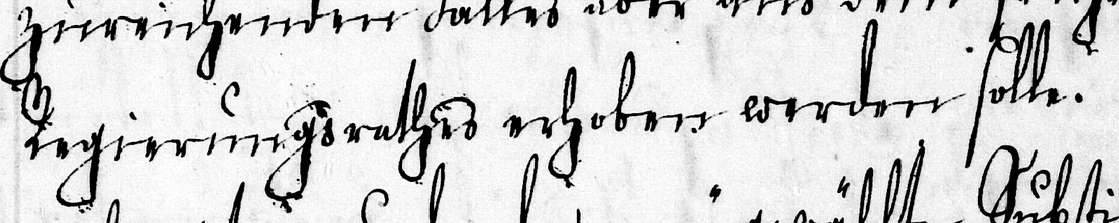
Regierungsrathes erhoben werden solle.
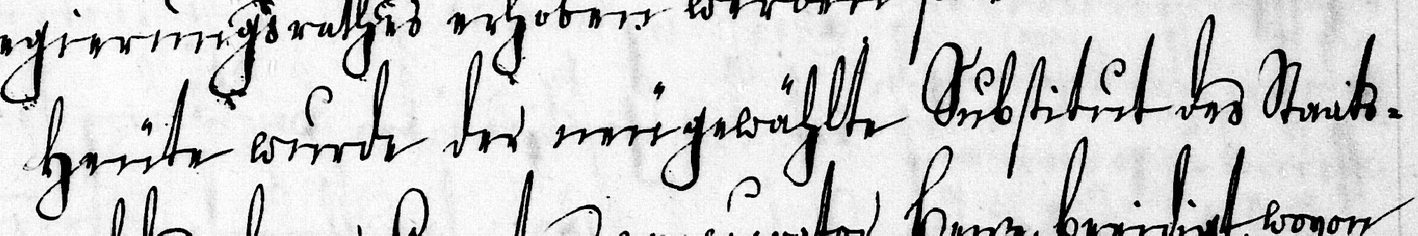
Heute wurde der neugewählte Substitut des Staat¬
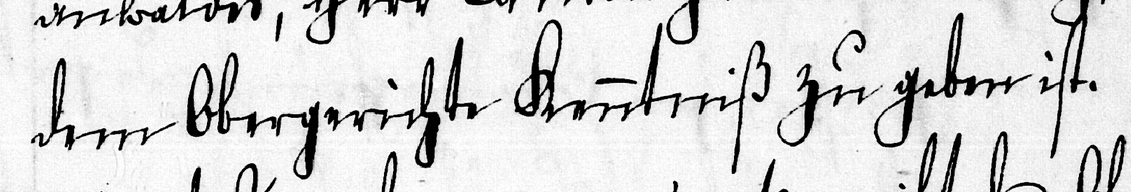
dem Obergerichte Kenntniß zu geben ist.
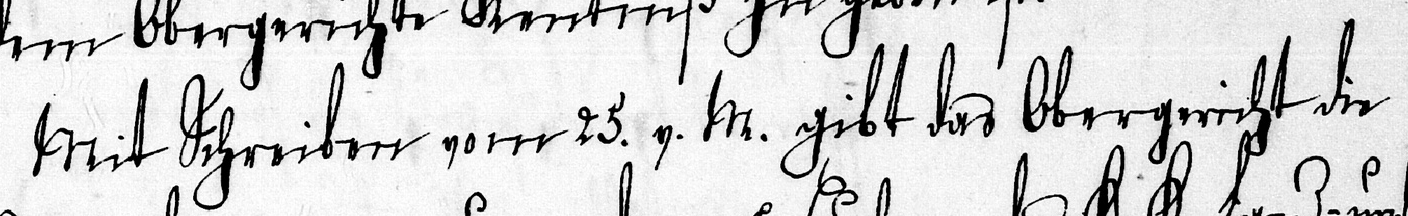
Mit Schreiben vom 25. v. M. gibt das Obergericht die
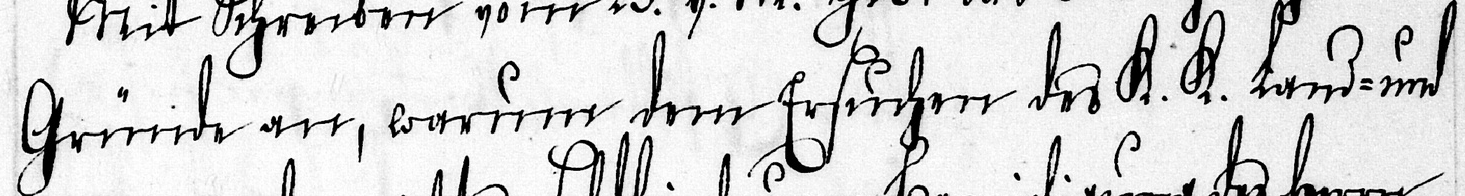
Gründe an, warum dem Ersuchen des K. K. Land- und
